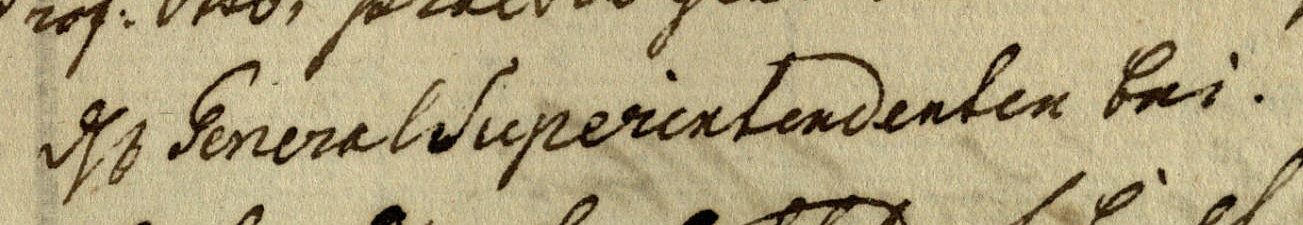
dh GeneralSuperintendenten bei.
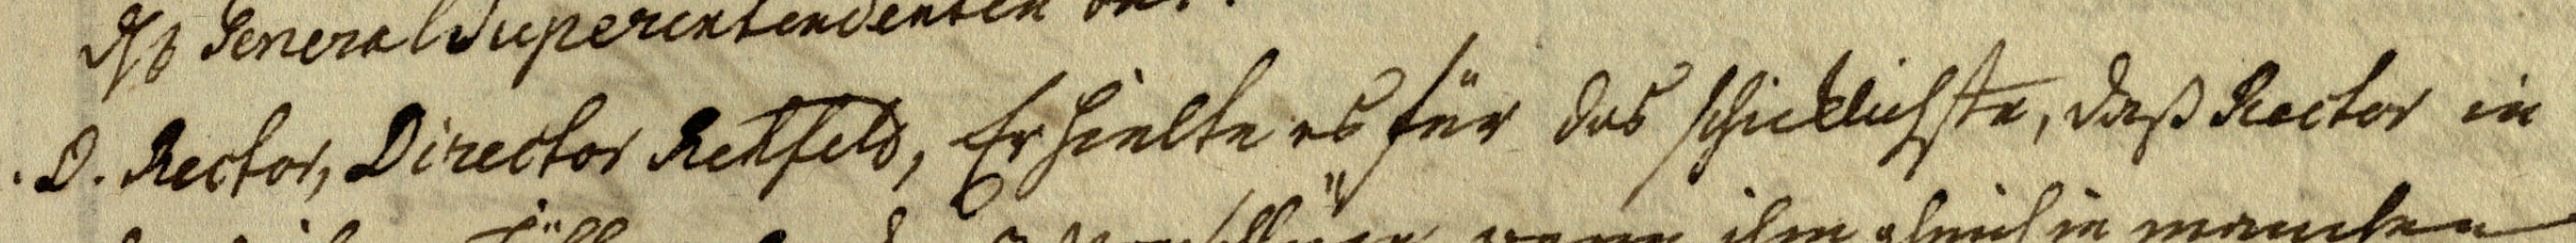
M. D. Rector, Director Rehfeld, Er hielte es für des schicklichste, daß Rector in
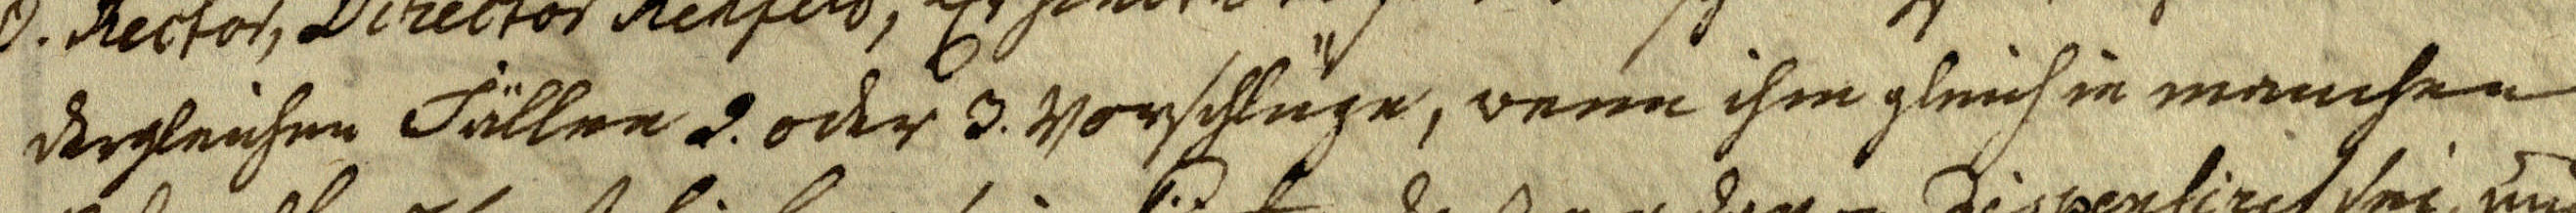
dergleichen Fällen 2. oder 3. vorschlüge, wenn ihm gleich in manchen
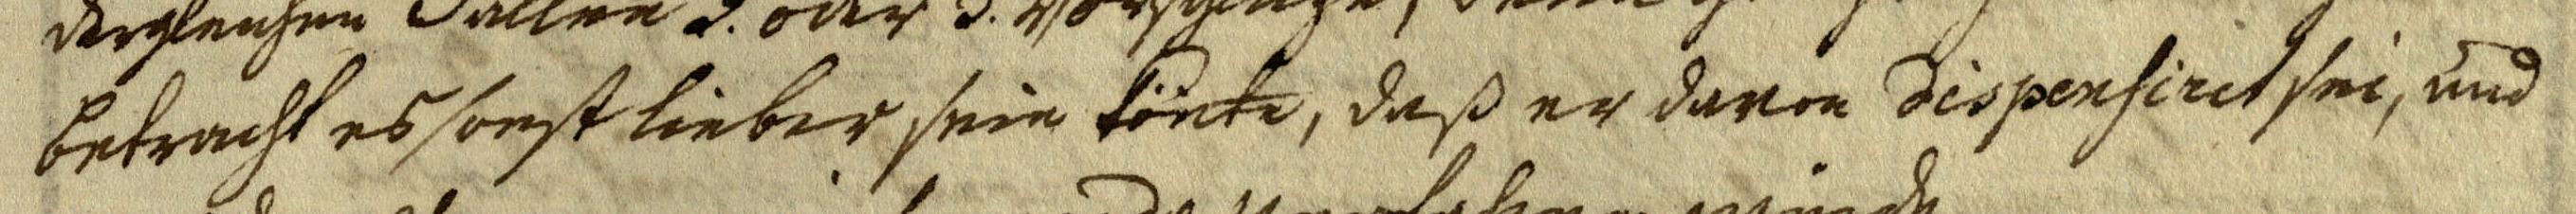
Betracht es sonst lieber sein könte, daß er davon dispensiret sei, und
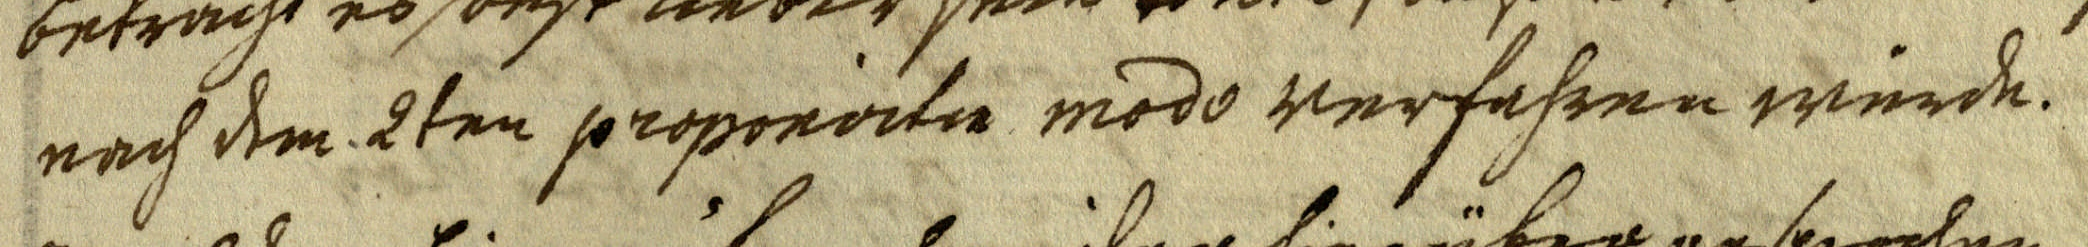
nach dem 2ten proponirten modo verfahren würde.
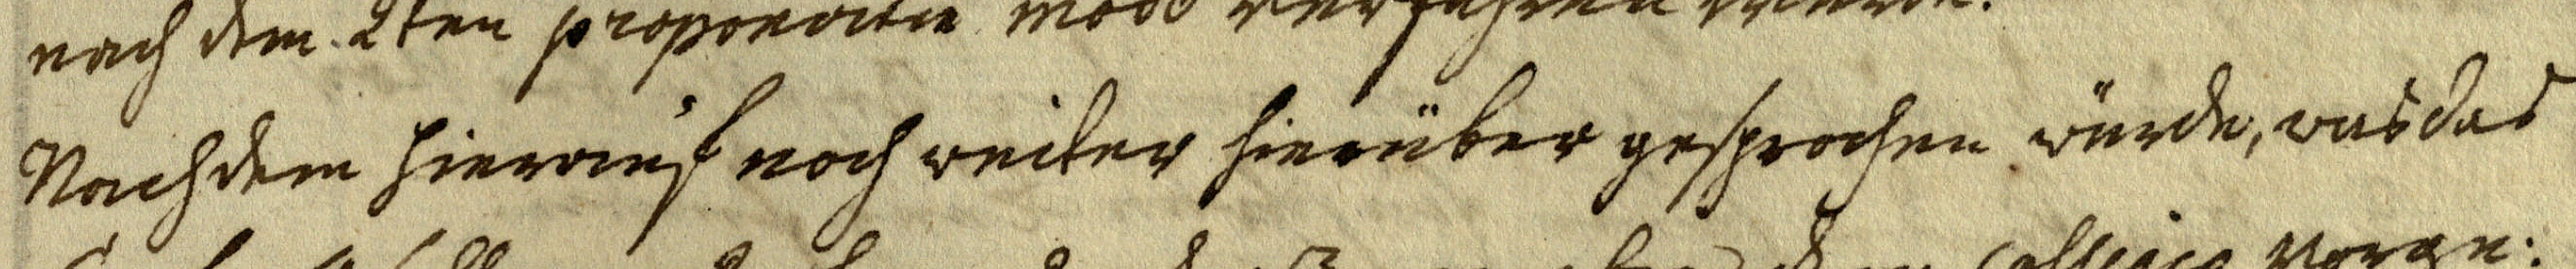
Nachdem hierauf noch weiter hierüber gesprochen würde, war das
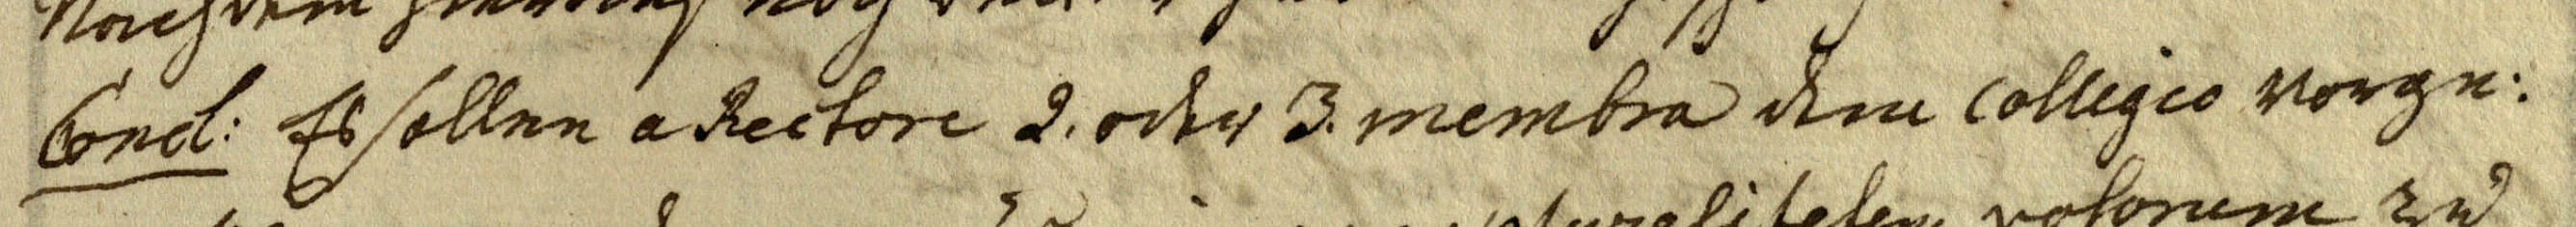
Concl. Es sollen a Rectore 2. oder 3. membra dem Collegio vorge¬
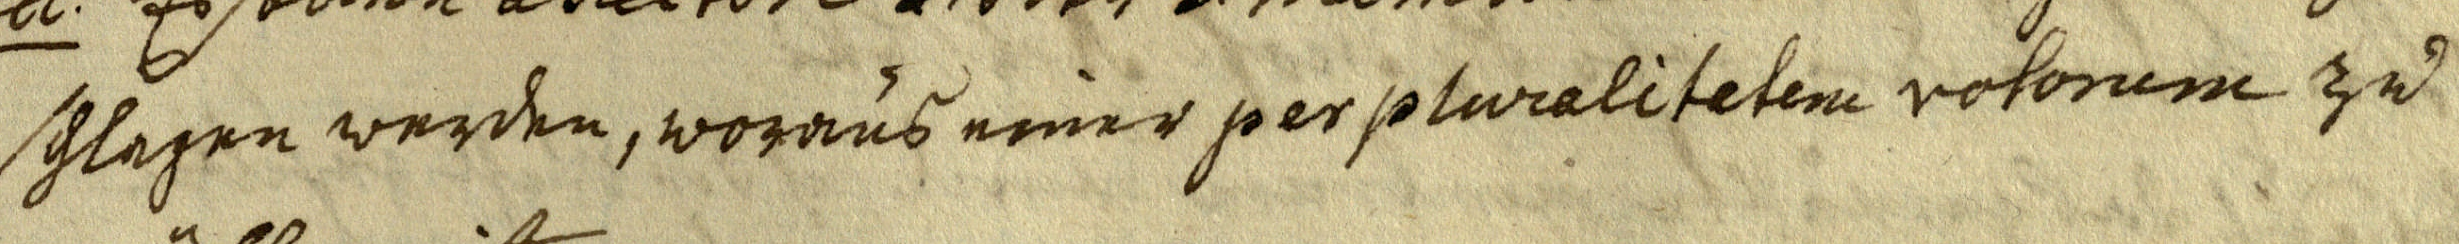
schlagen werden, woraus einer per pluralitatem votorum zu
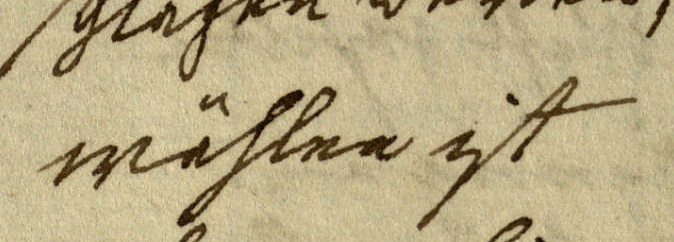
wählen ist
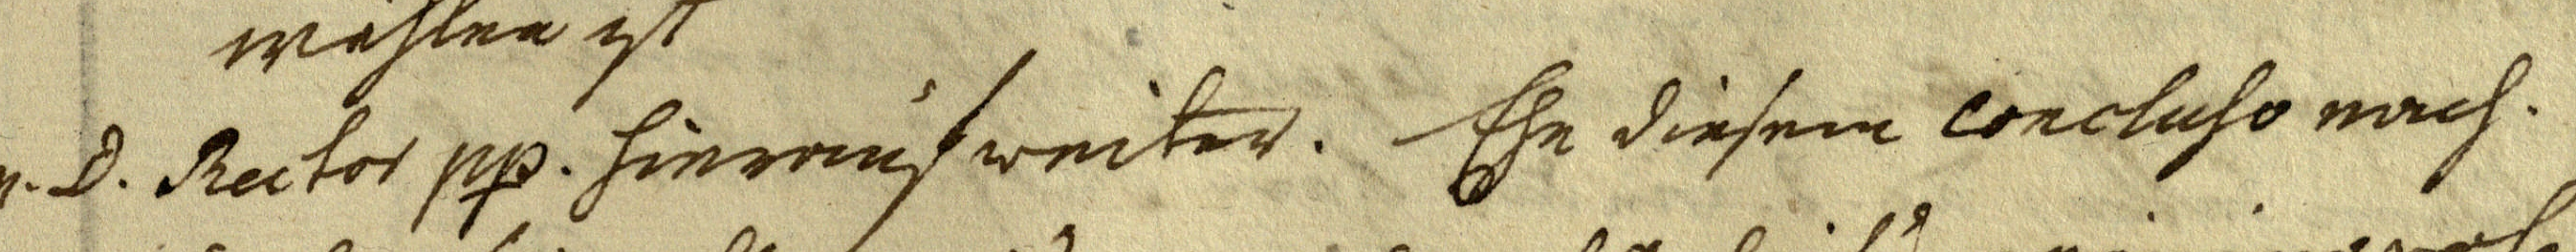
M. D. Rector pp. hierauf weiter. Ehe diesem Concluso nach¬
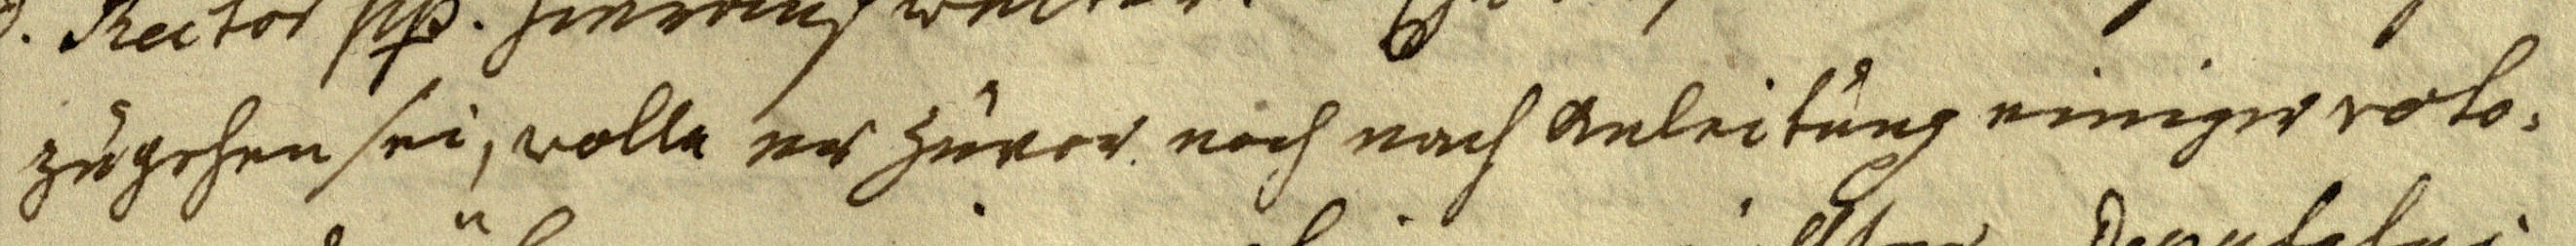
zugehen sei, wolle er zuvor noch nach Anleitung einiger voto¬
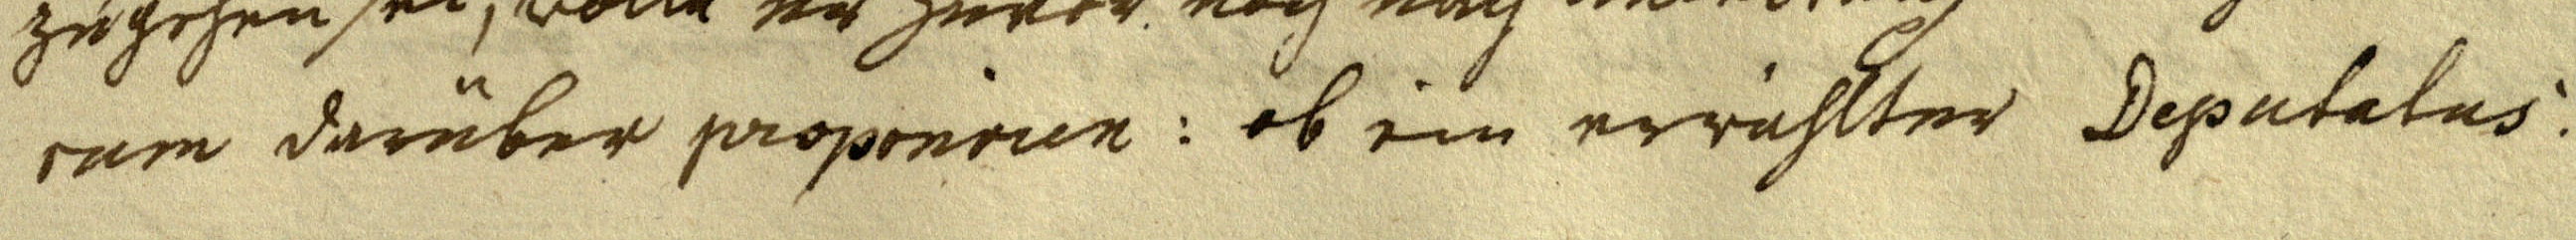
rum darüber proponiren: ob ein erwählter Deputatus
